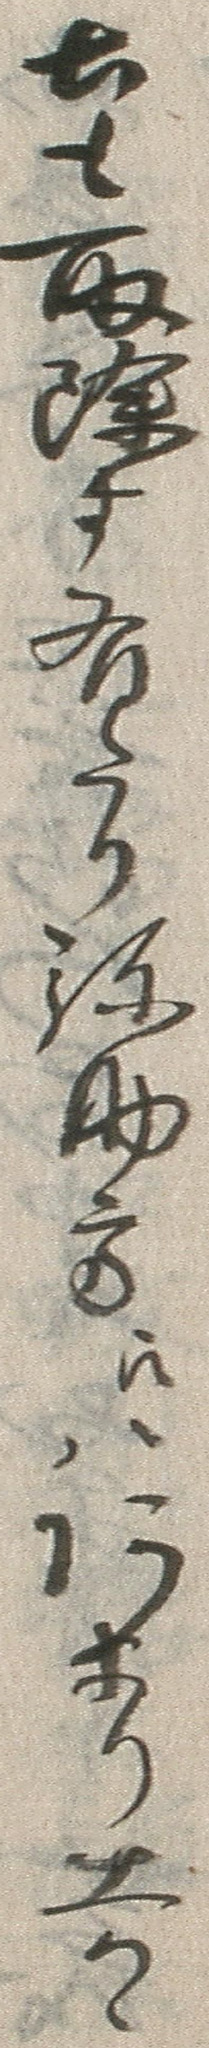土も取除に有たり弥助方えはあまり土かゝ
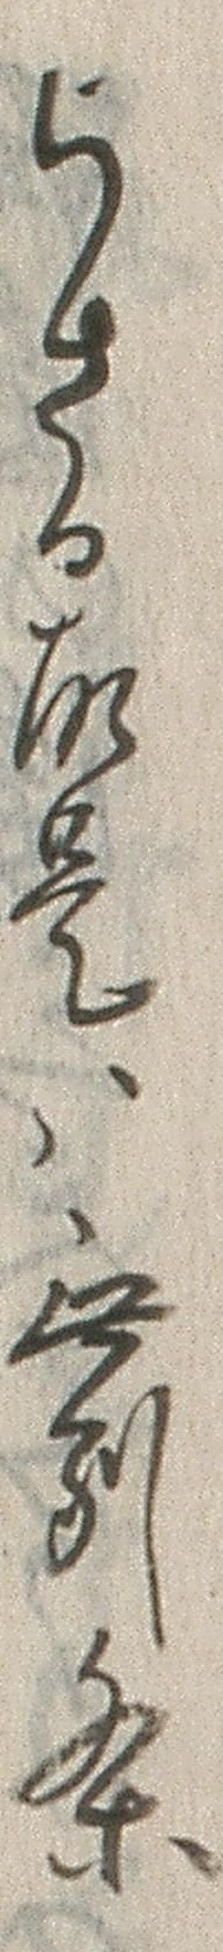らさる故是は無別条
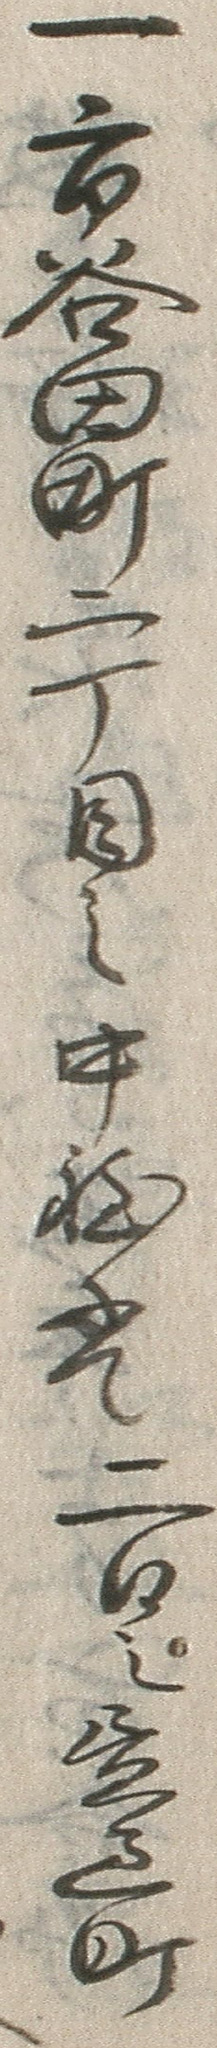一市谷田町二丁目之中程にて二日之昼過町
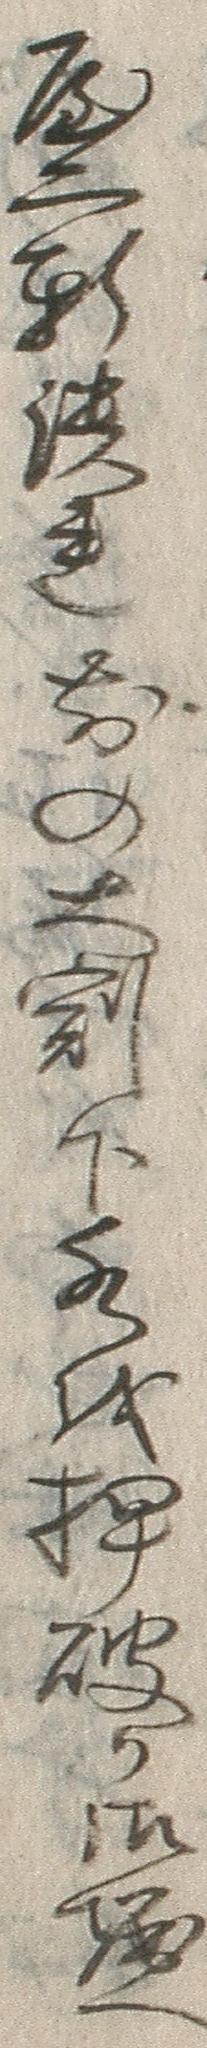屋二軒潰れ前の大割下水を押破り御堀へ
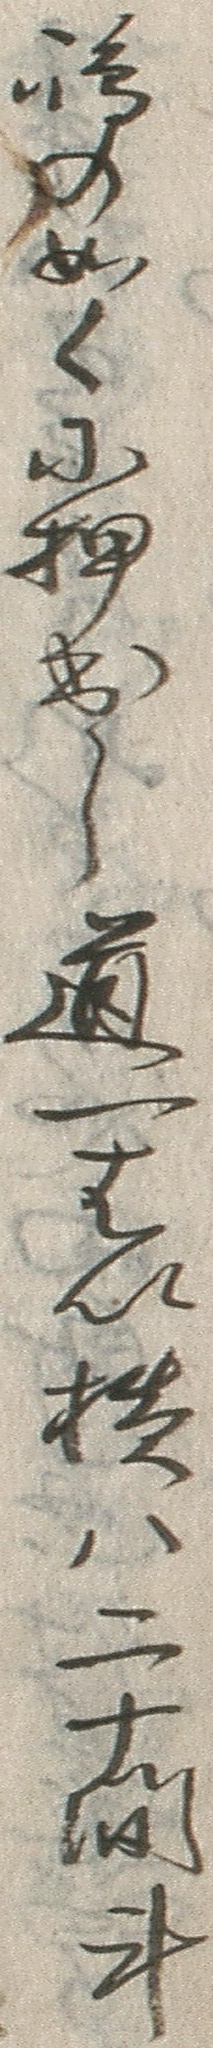嶋の如くに押出し道一はい横は二十間斗
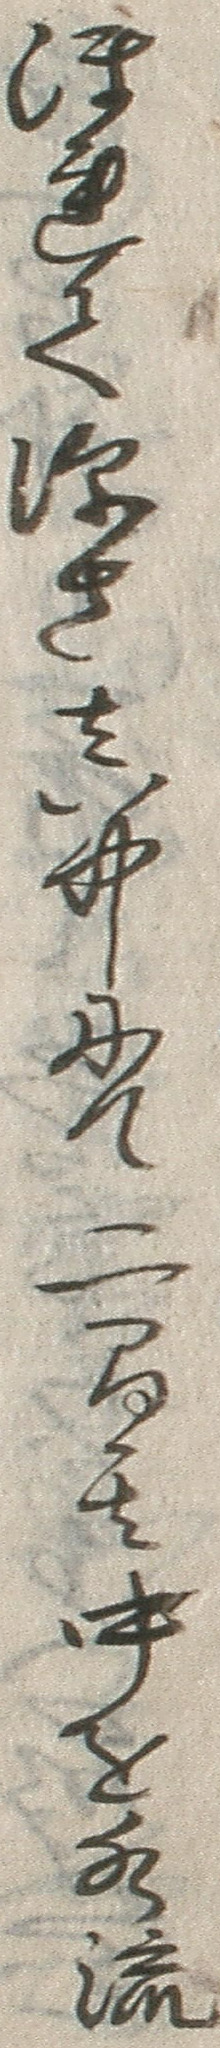ほれて深き真中にて二間其中を水流
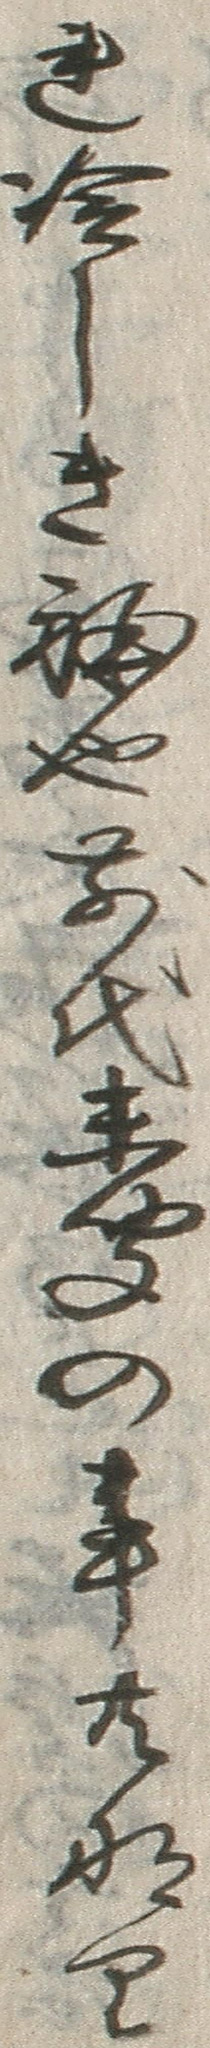れ珍しき体也前代未聞の事共なり
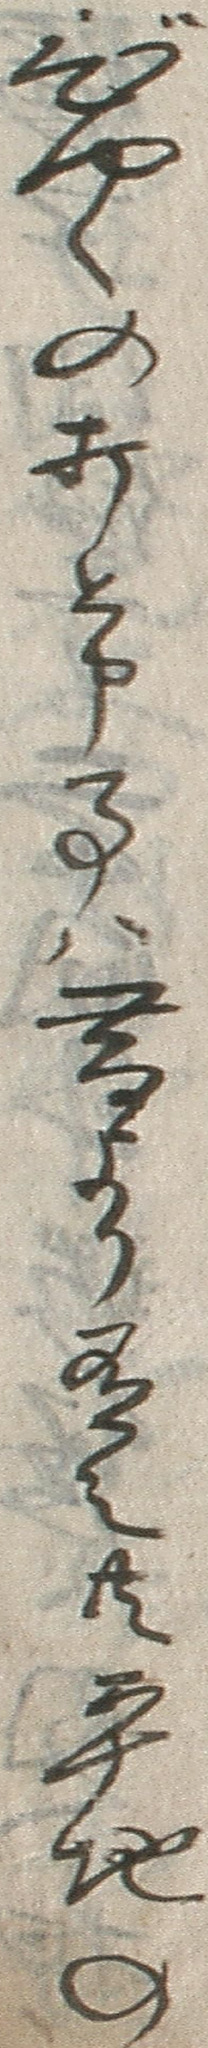びやくの打と申事は昔より有之共平地の

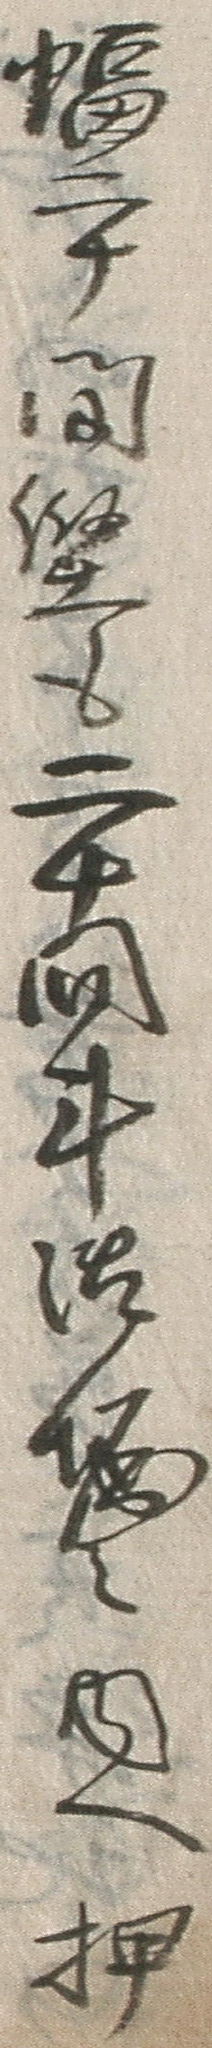幅二十間竪も二十間計御堀之内へ押
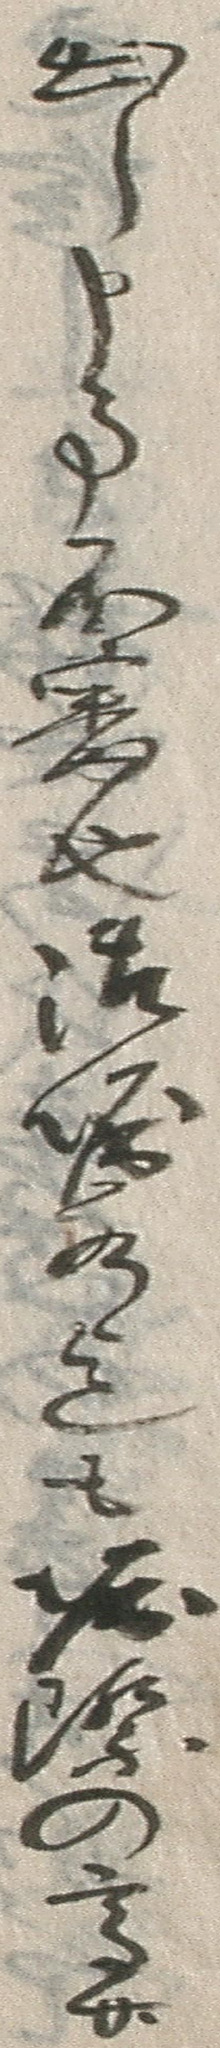出し申事不審也御堀水迄も堀際の高サ
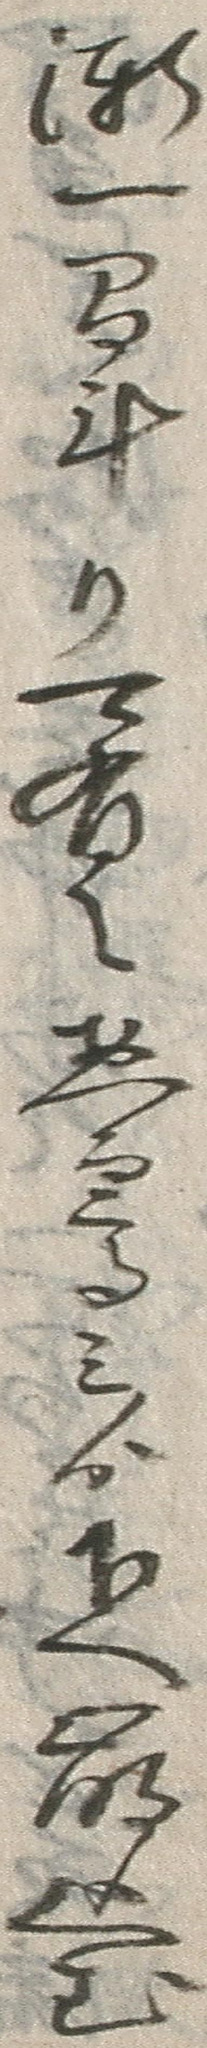漸一間計り可有之惣て高みゟ下へ崩込む
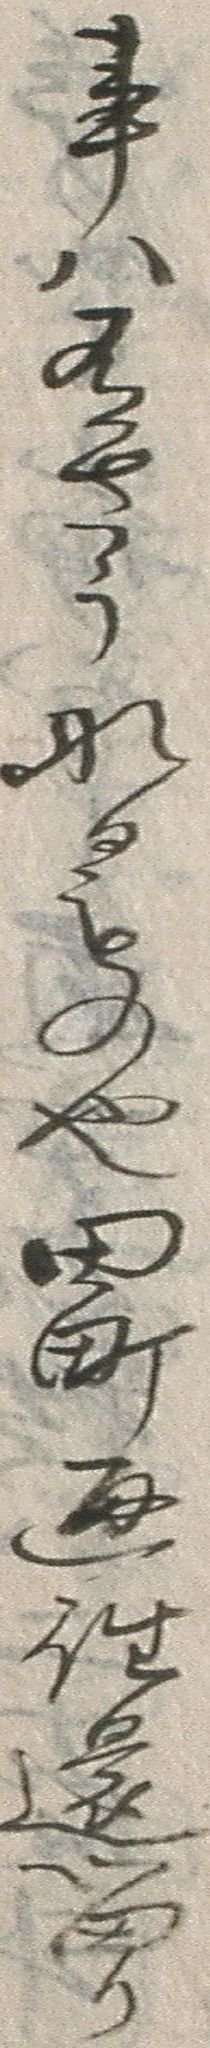事は有さうなるもの也田町通往還留り
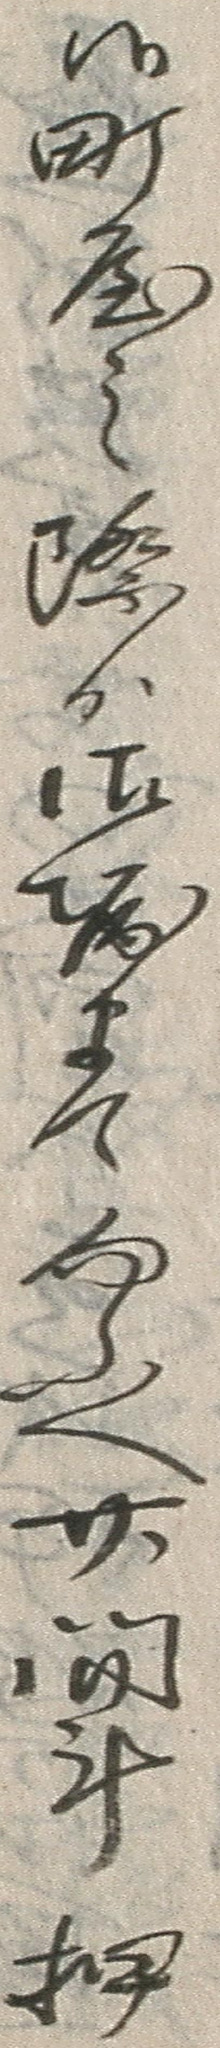候町屋之際ゟ御堀まて向ふへ廿間計押
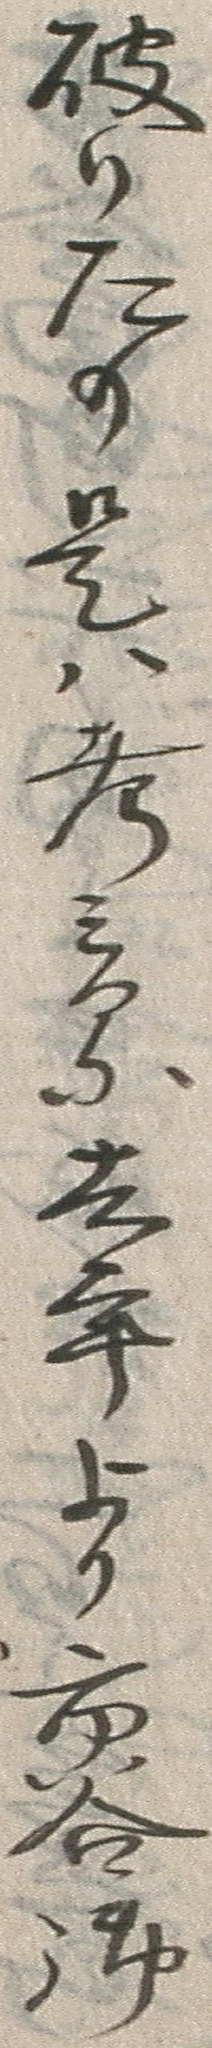破りたり是は考みるに去年より市谷御
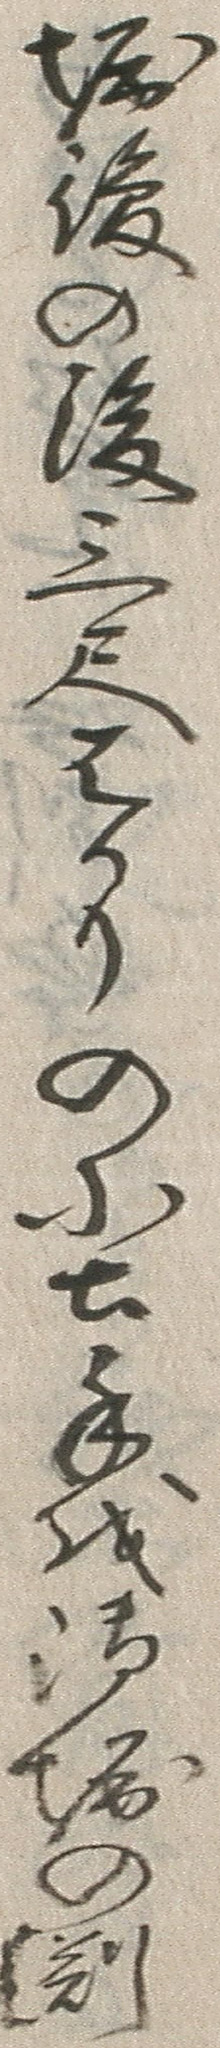堀浚の後三尺はかりの小土手を御堀の渕
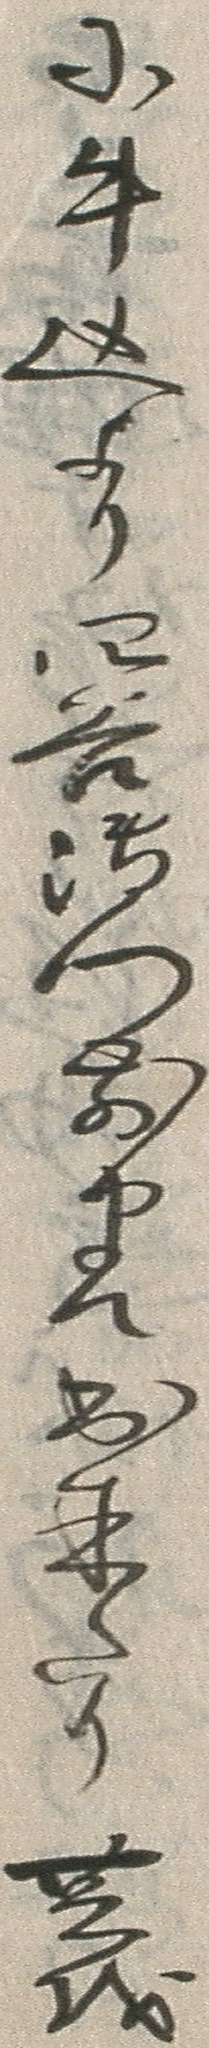に牛込より四谷御門前まて出来たり芝を
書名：享保十三年江戸洪水記
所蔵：東京大学地震研究所図書室 Earthquake Research Institute Library, The University of Tokyo, JAPAN
